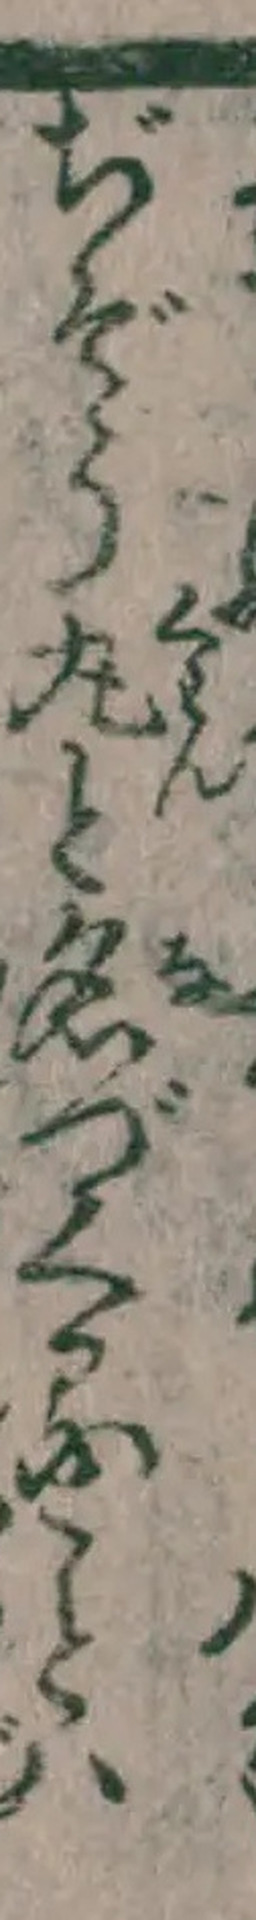ぢぞう丸と名づくることは
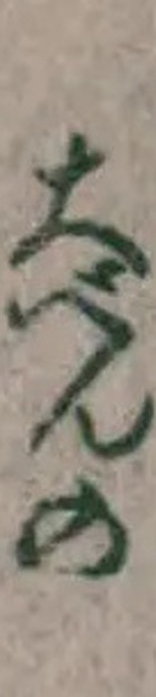大べんの
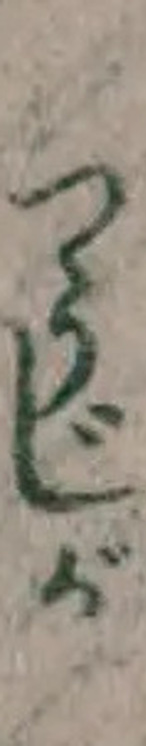つうじが
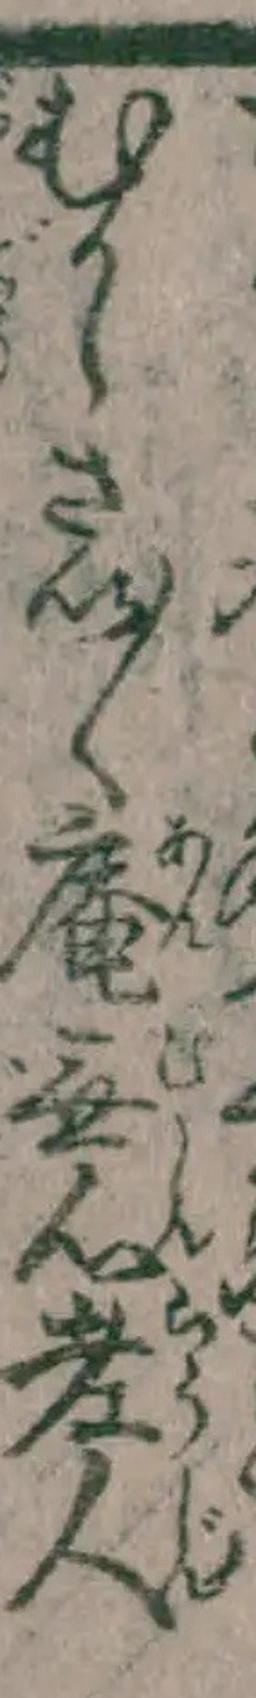むかしさい〳〵庵無心老人
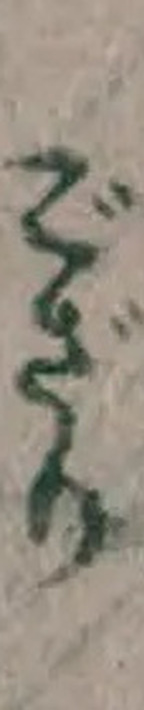ござり
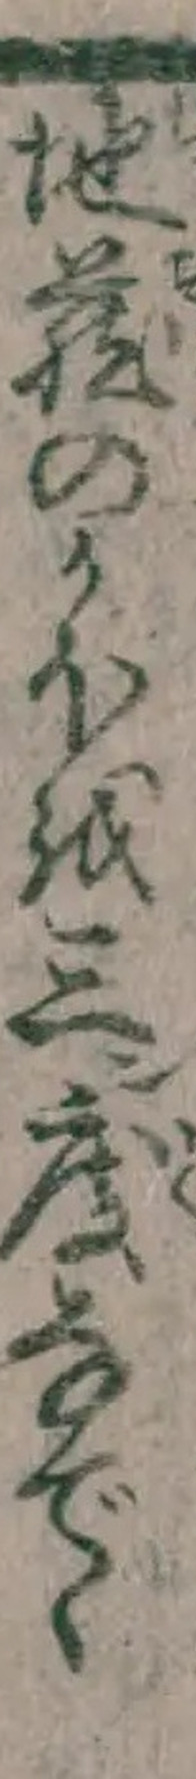地蔵のかほを三ン度なでゝ
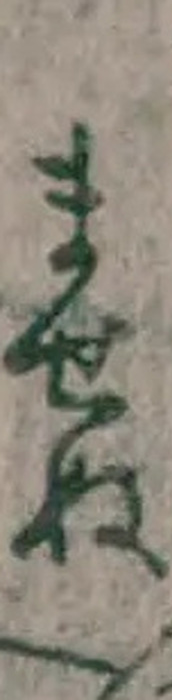ませぬ
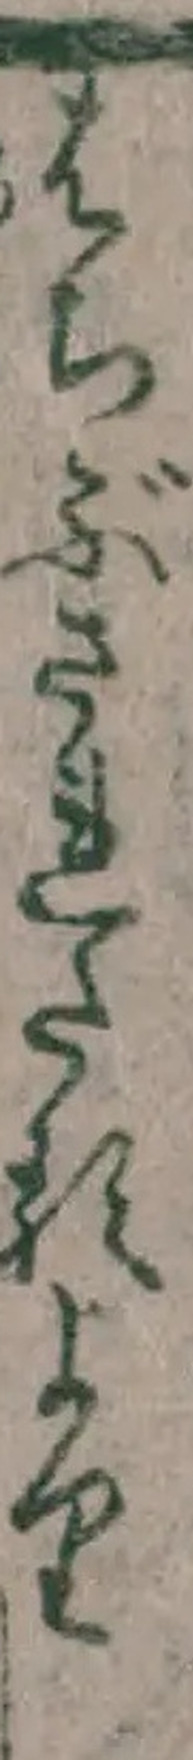はちぶされたるより
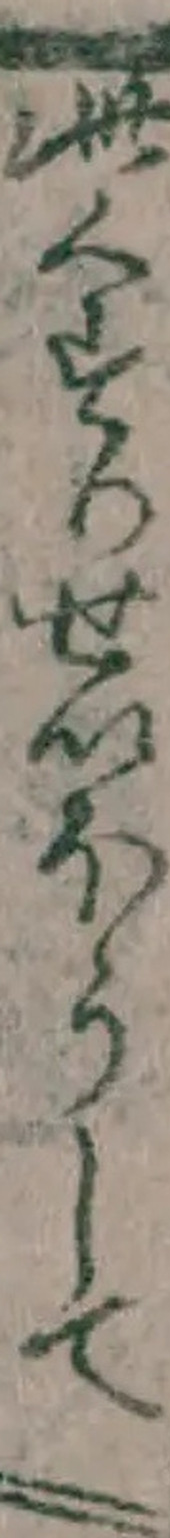此くすりせいほうして
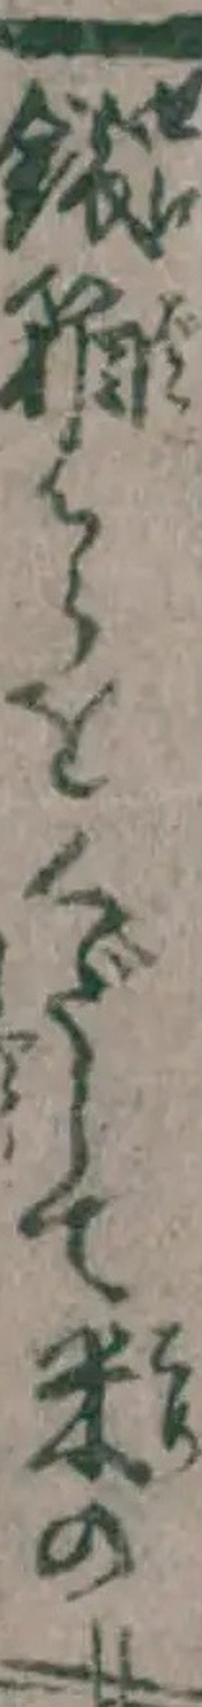銭箱はらをくだして米の
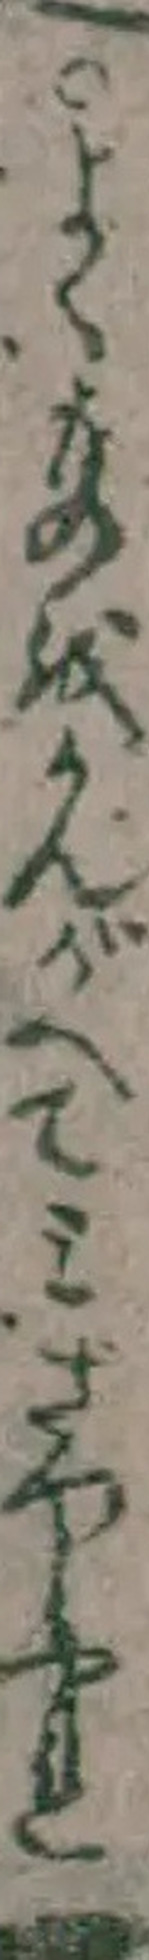○よくものをかんがへてみさつしやれ
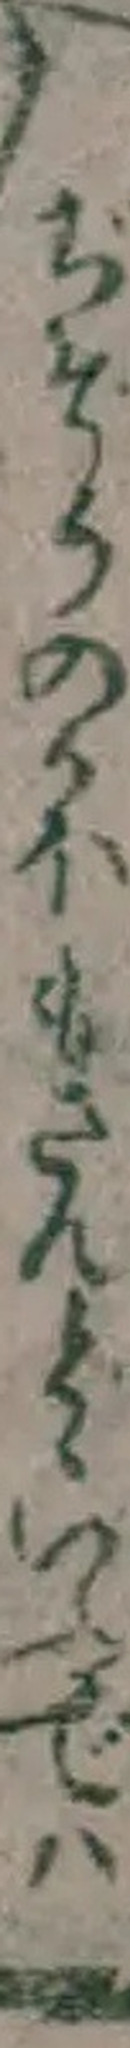ぢぞうのかほもさんどゝいふでは
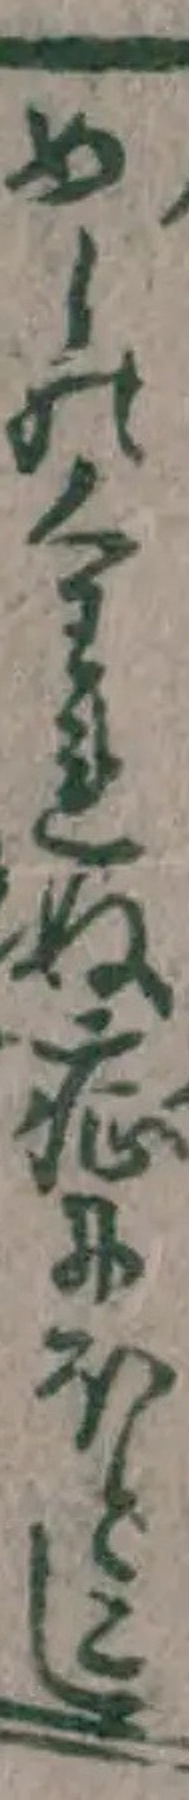めしのくわれぬ症にほとこし
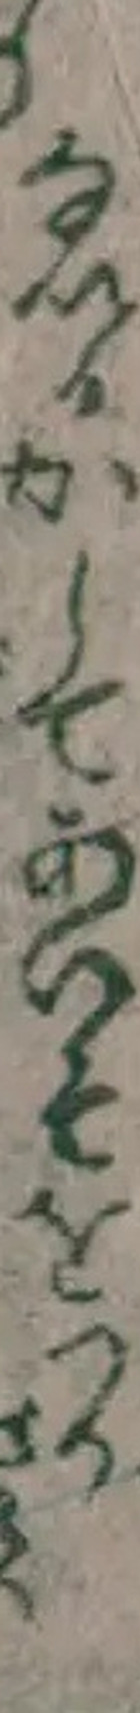ないかかしてあいそをつかさて
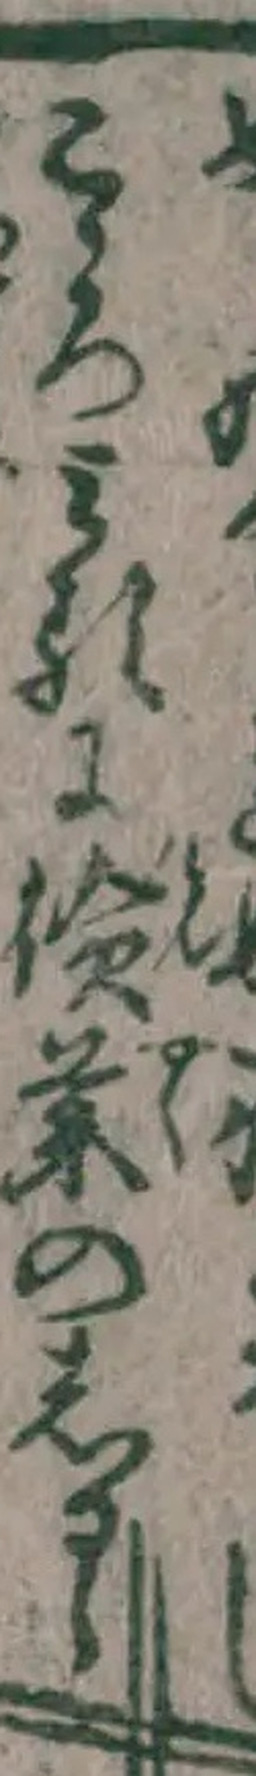こゝろみるに倹薬のしるし
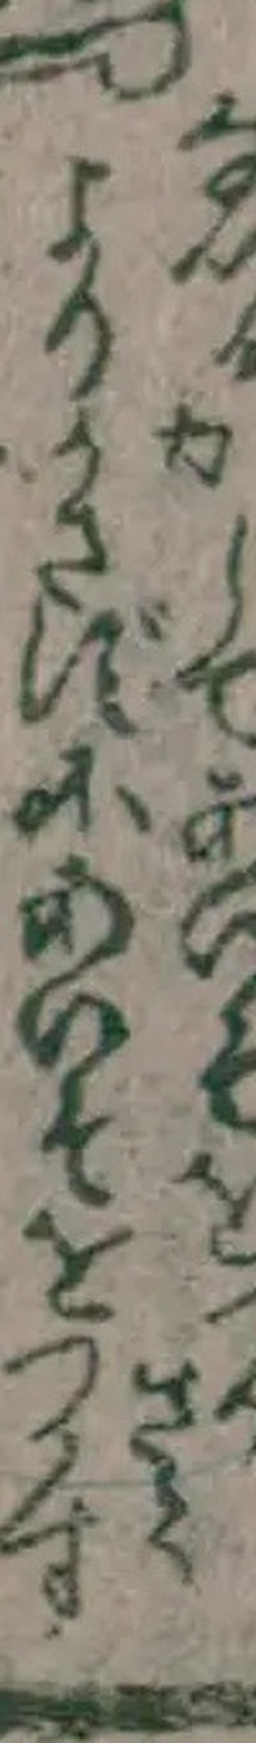よりかさずにあいそをつかす
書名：視薬霞報条 3巻
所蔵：国立国会図書館 National Diet Library, JAPAN
